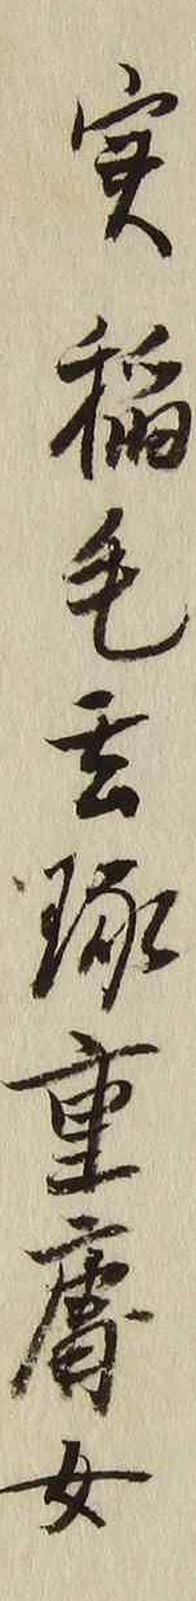実稲毛玄琢重庸女

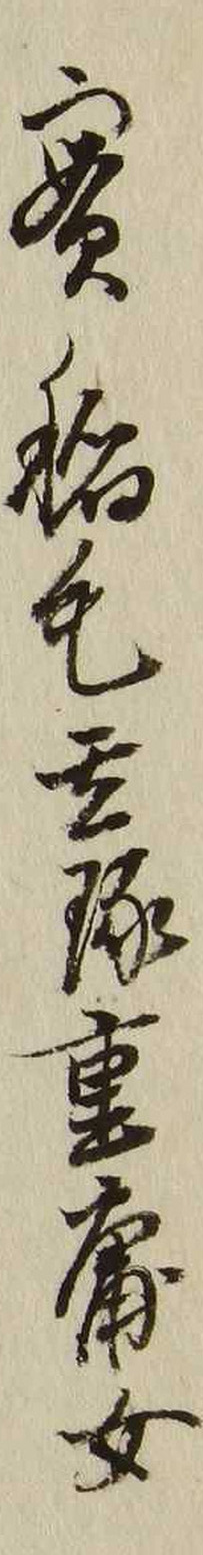実稲毛玄琢重庸女
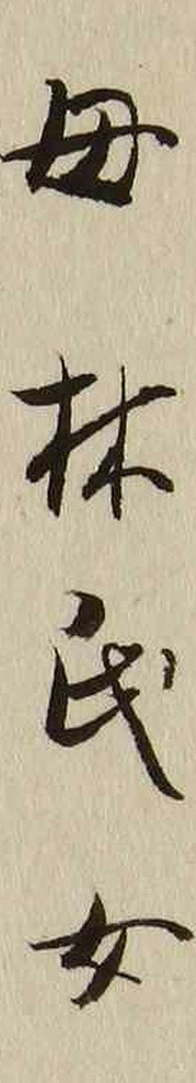母林氏女
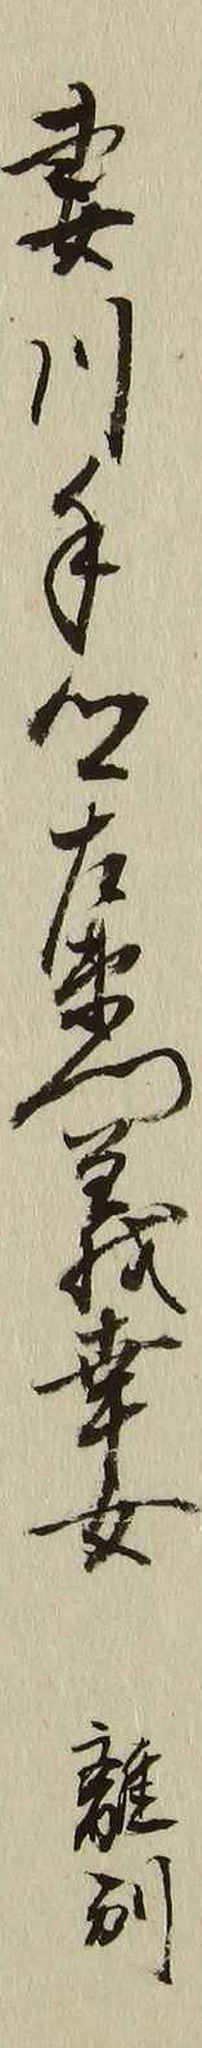妻川手郷左衛門義幸女離別
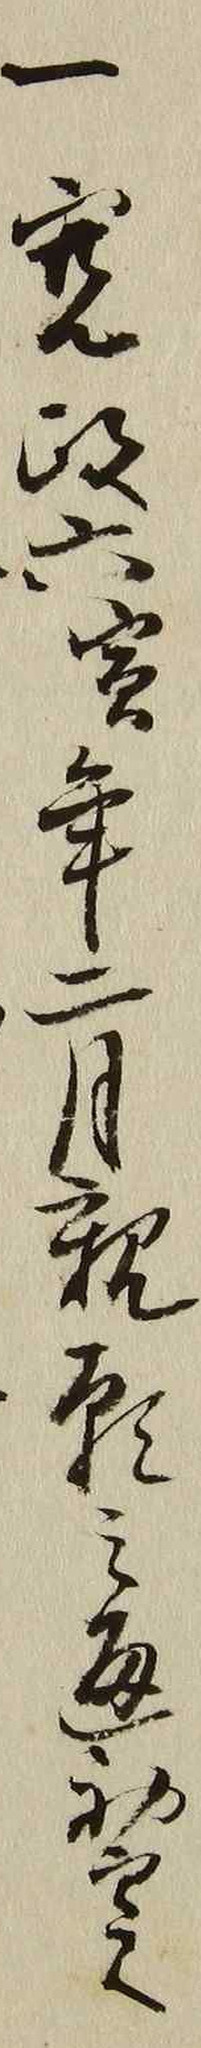一寛政六寅年二月親願之通初而之
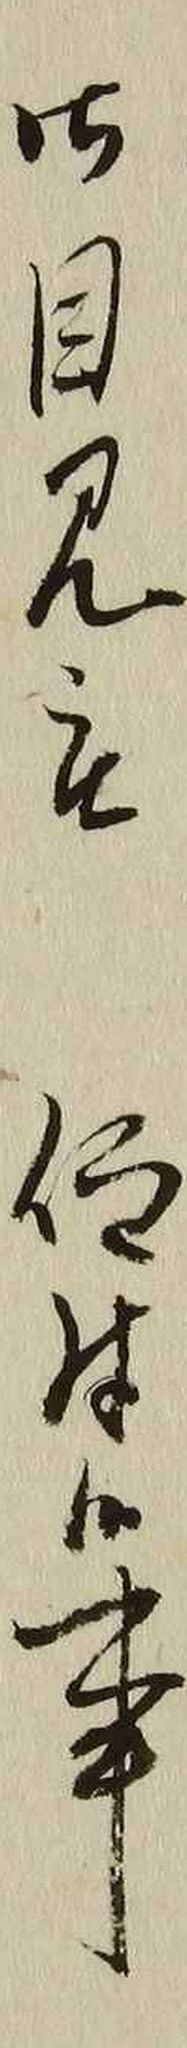御目見被仰付候事
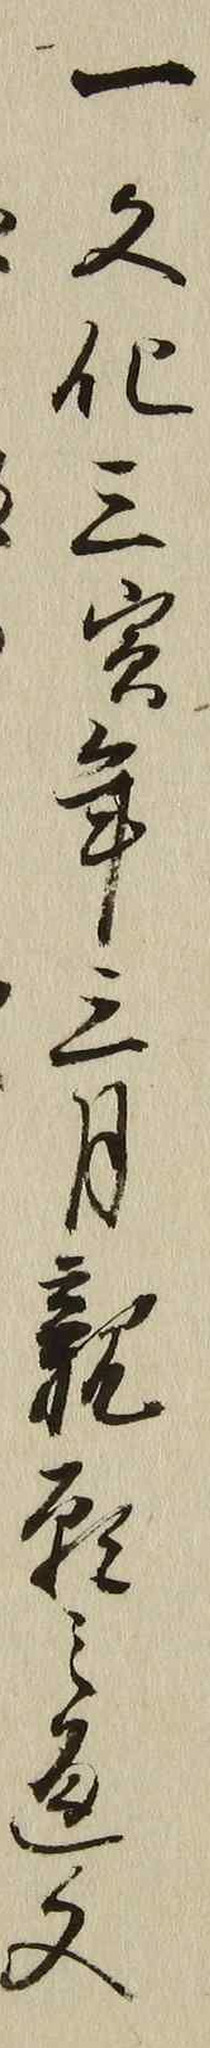一文化三寅年三月親願之通文
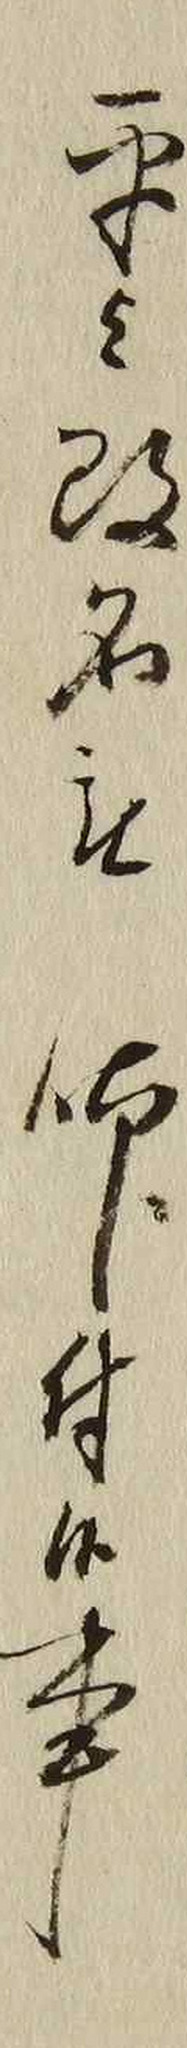平与改名被仰付候事
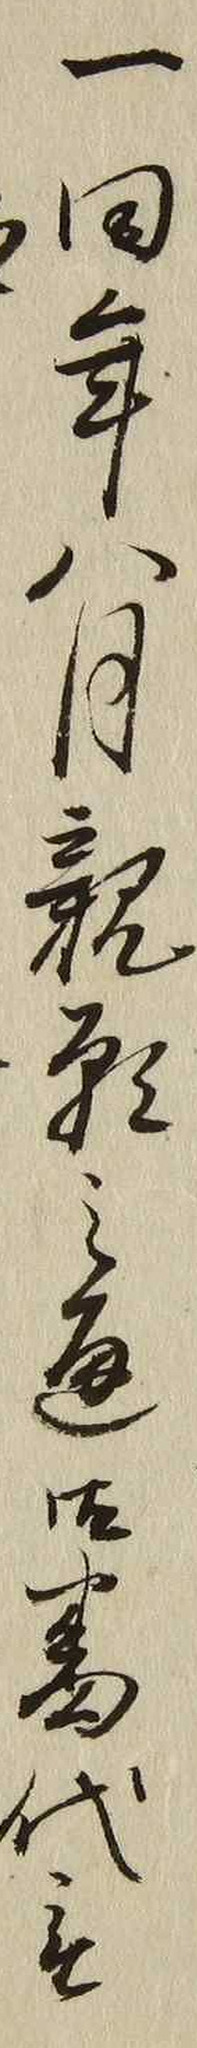一同年八月親願之通御番代被
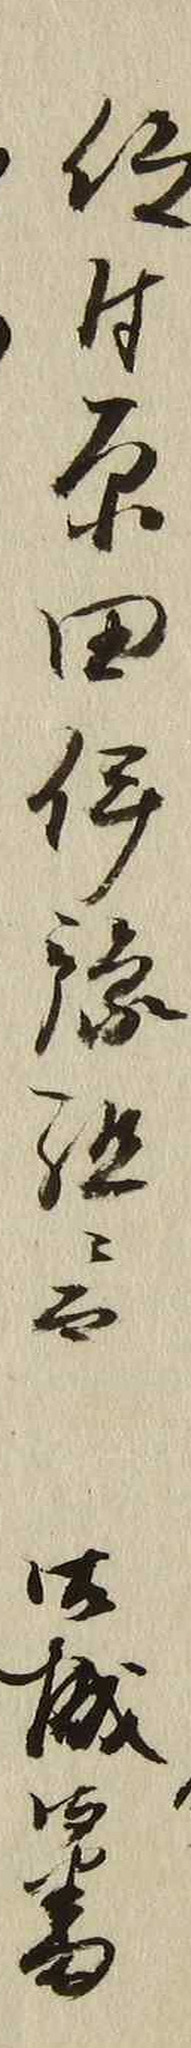仰付原田伊予組ニ而御城御番
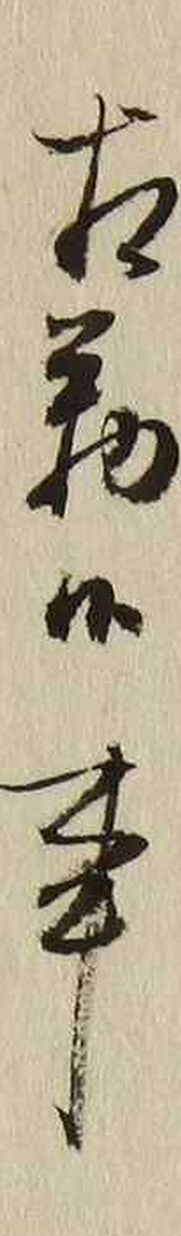相勤候事
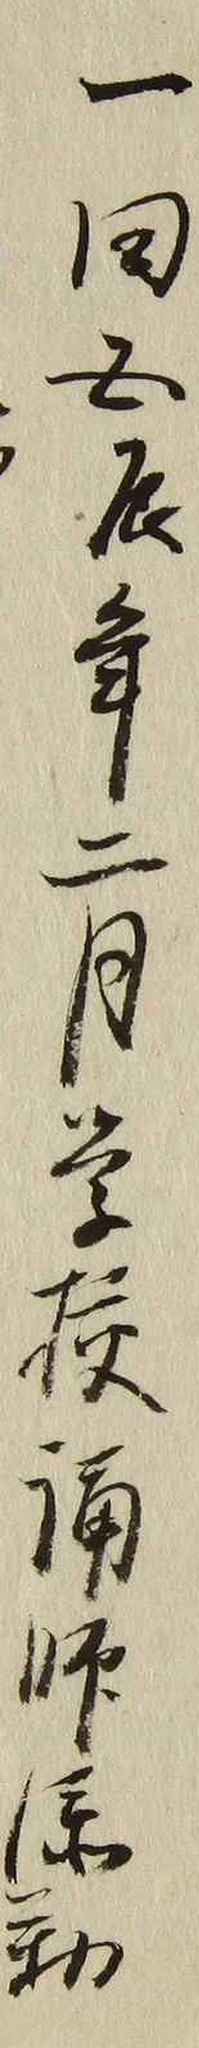一同五辰年二月学校誦師添勤
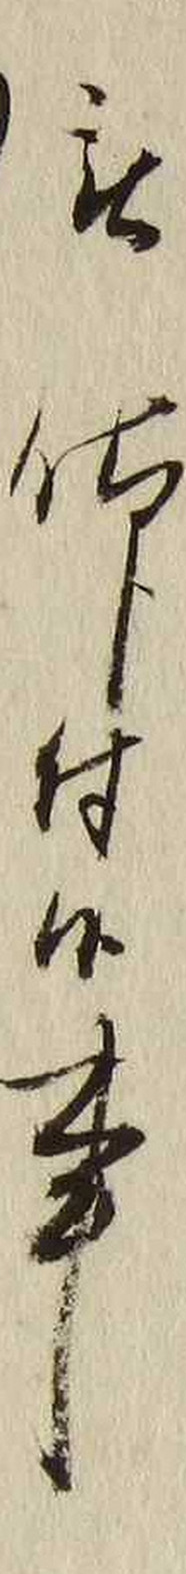被仰付候事
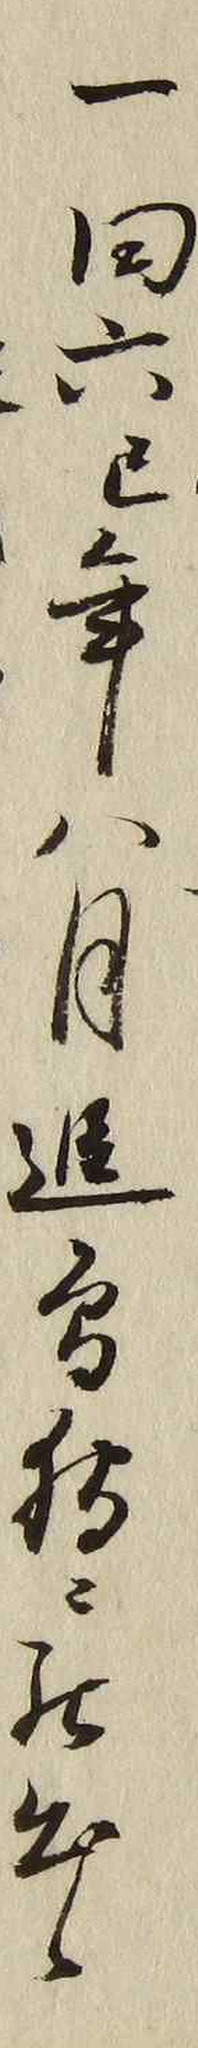一同六巳年八月追鳥狩ニ罷出候
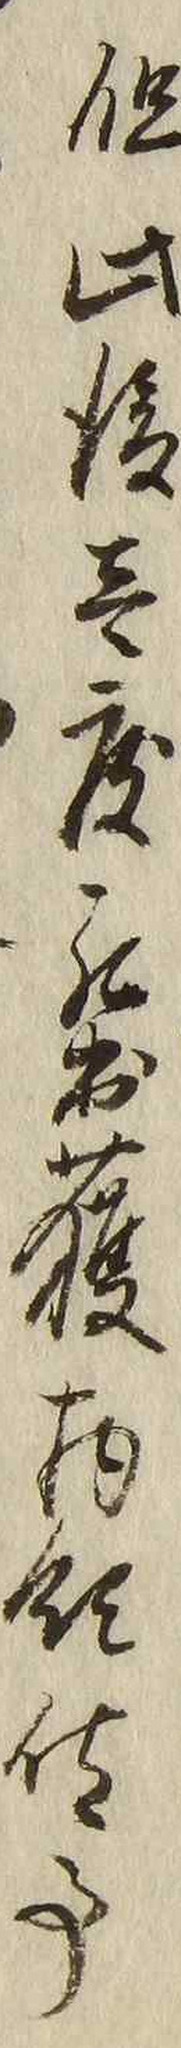但此後壱度罷出獲拝領仕候事
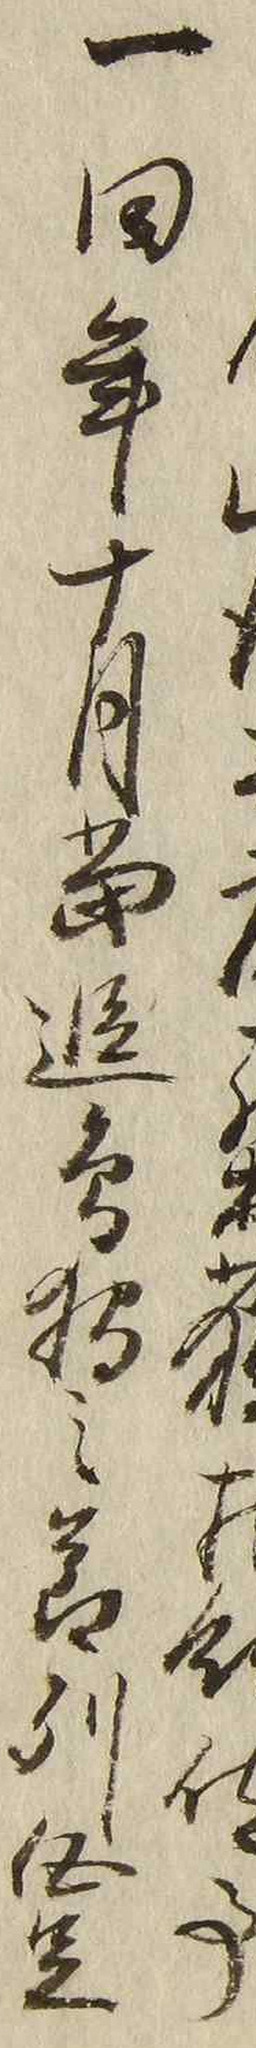一同年十月当追鳥狩之節列伍足
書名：諸士系譜　巻之348　も之部4
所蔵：会津若松市立会津図書館
